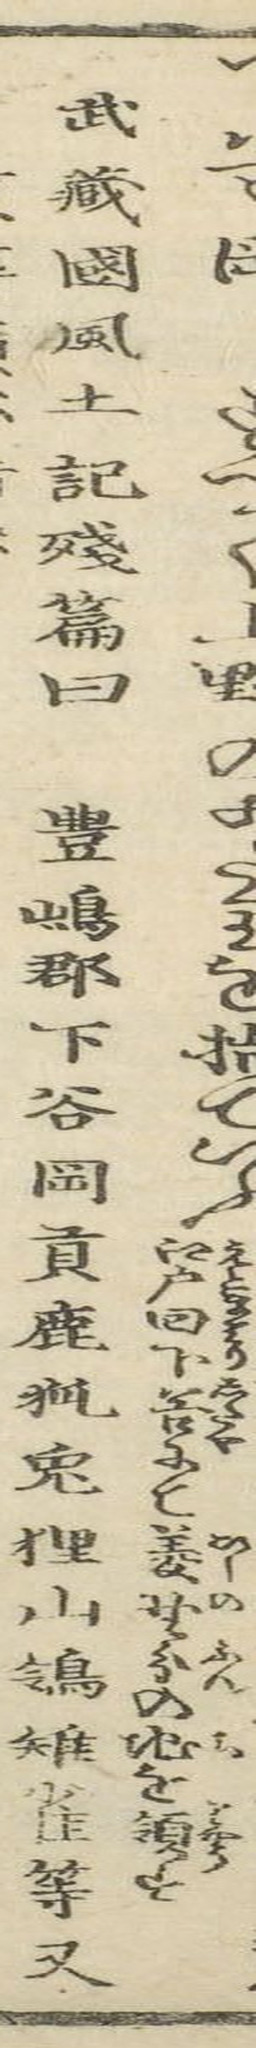武蔵国風土記残篇曰豊嶋郡下谷岡貢鹿狐兎狸山鴒雉雀等又
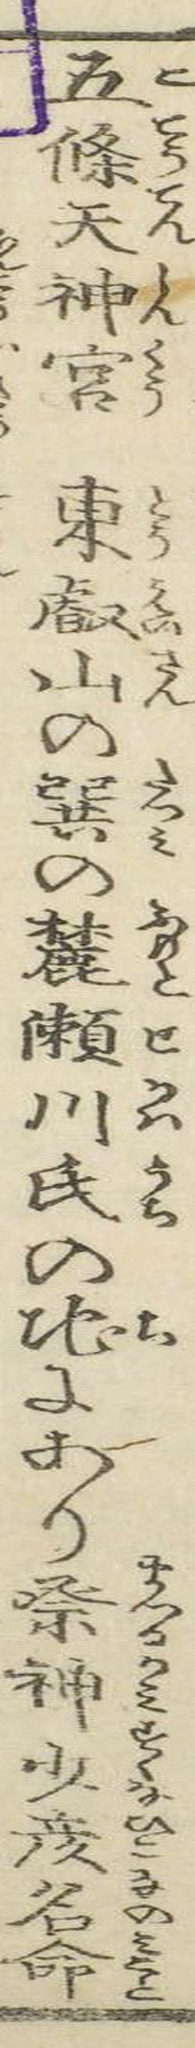五條天神宮東叡山の巽の麓瀬川氏の地にあり祭神少彦名彦命
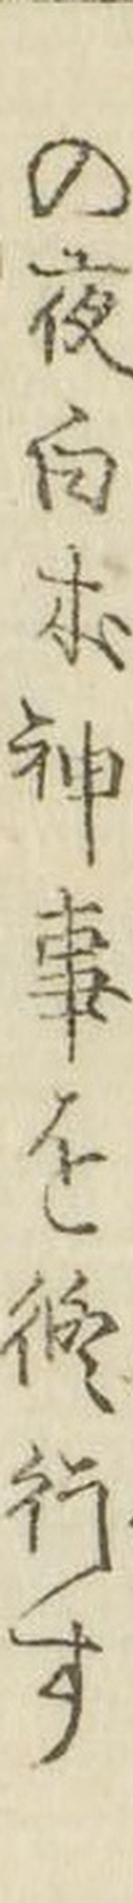の夜白朮神事を修行す
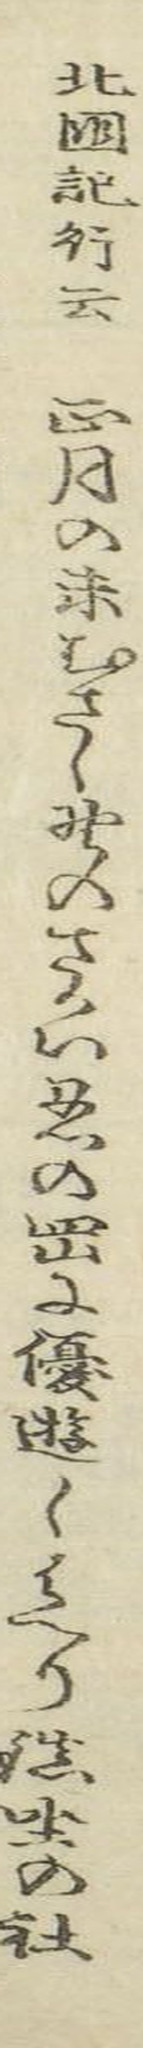北国記行云正月の末むさし野のさかい忍の岡に優遊しはへり鎮座の社
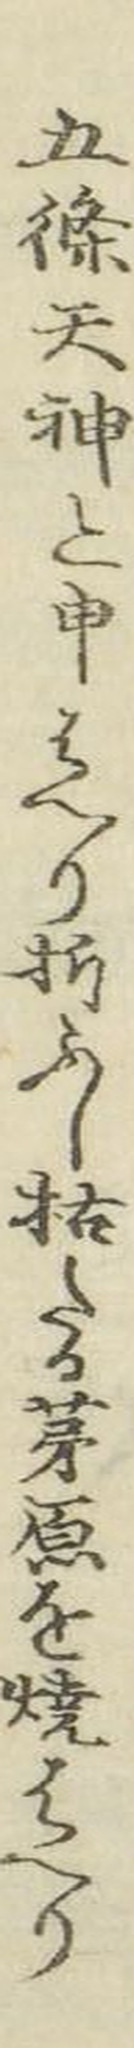五條天神と申はへり折ふし枯たる茅原を焼はへり
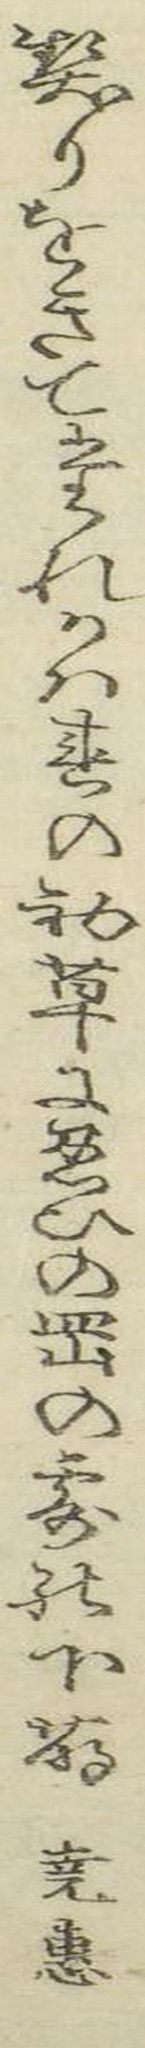契りをきてたれかは春の初草に忍ひの岡の露の下萌堯恵
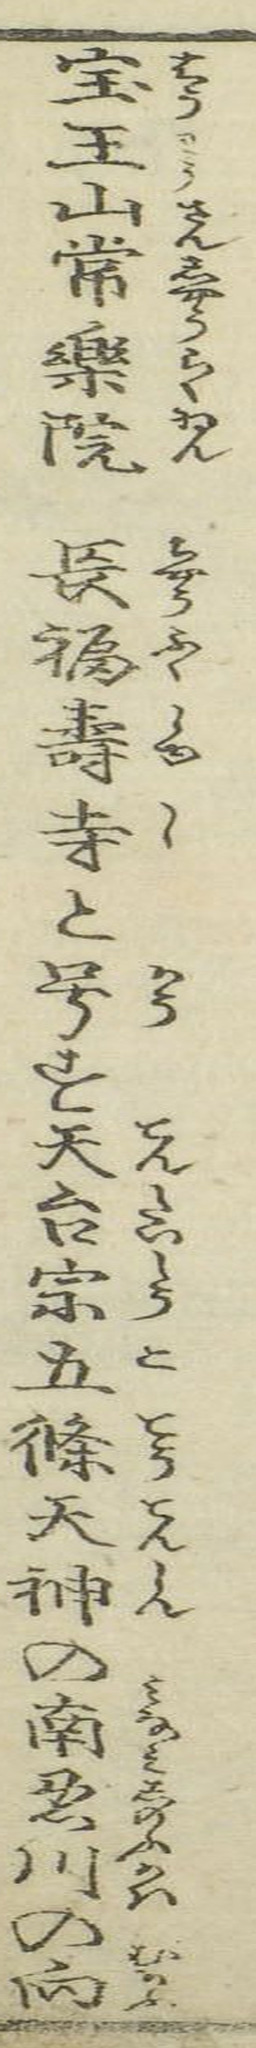宝王山常楽院長福寿寺と号す天台宗五條天神の南忍川の向
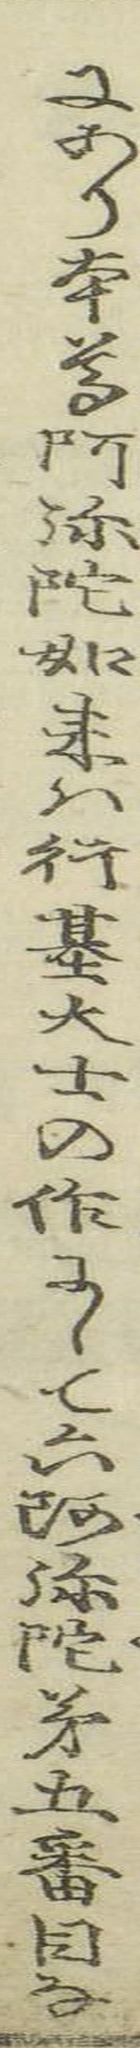にあり本尊阿弥陀如来は行基大士の作にして六阿弥陀第五番目な
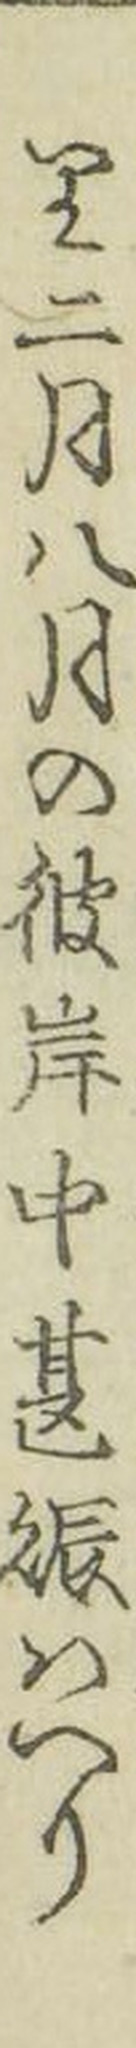り二月八月の彼岸中甚賑はへり

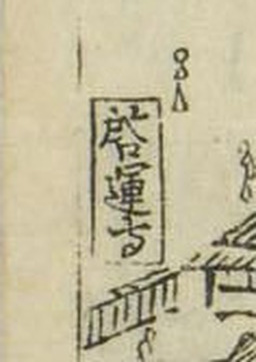啓運寺

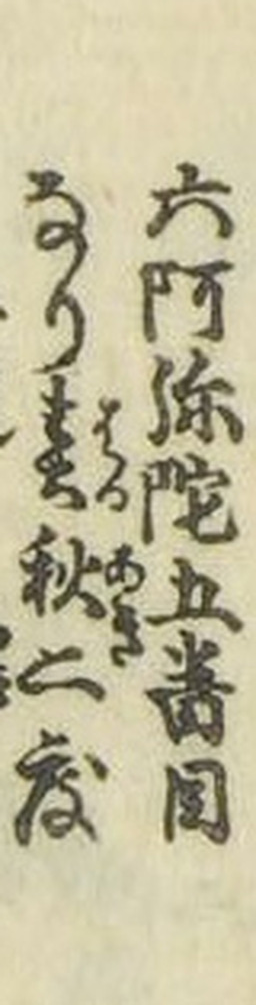なり春秋二度
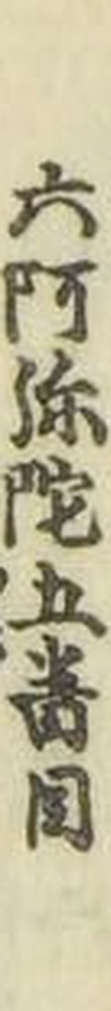六阿弥陀五番目
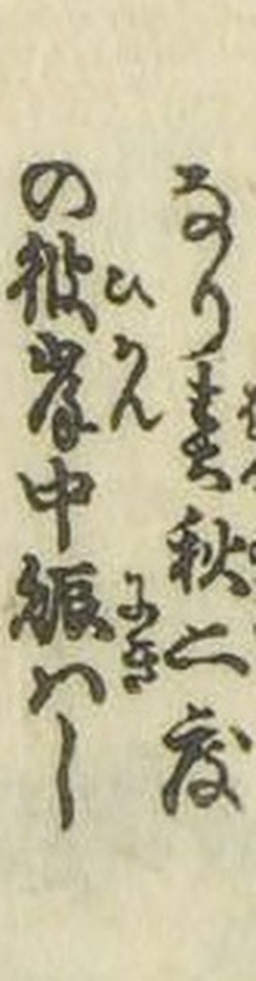の彼岸中賑はし

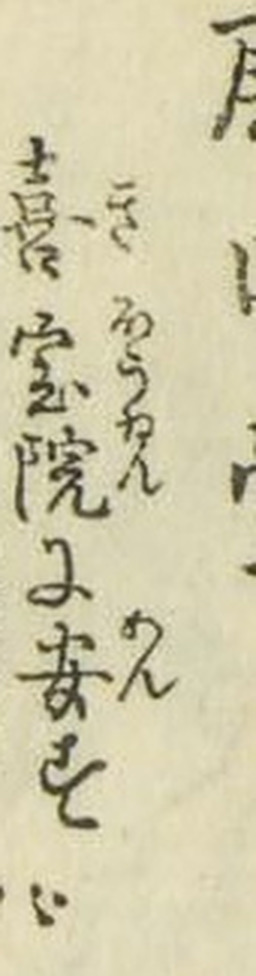喜宝院に安す
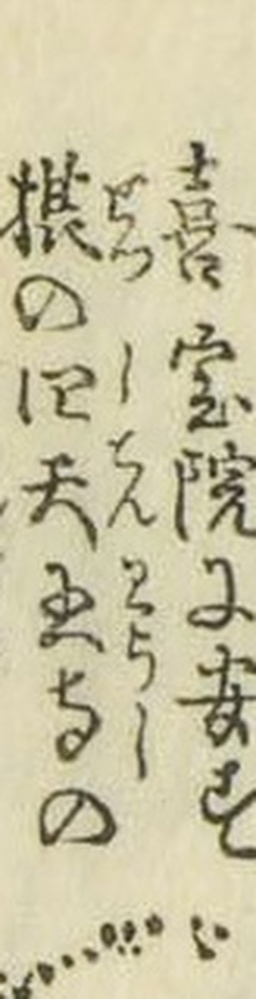摂の四天王寺の
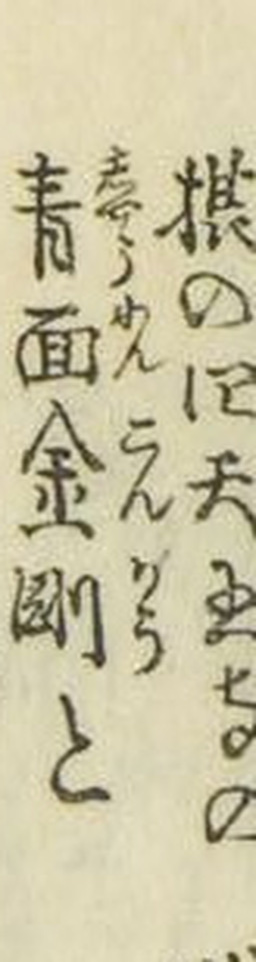青面金剛と
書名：江戸名所図会 20巻 巻之17
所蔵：東京学芸大学教育コンテンツアーカイブ
